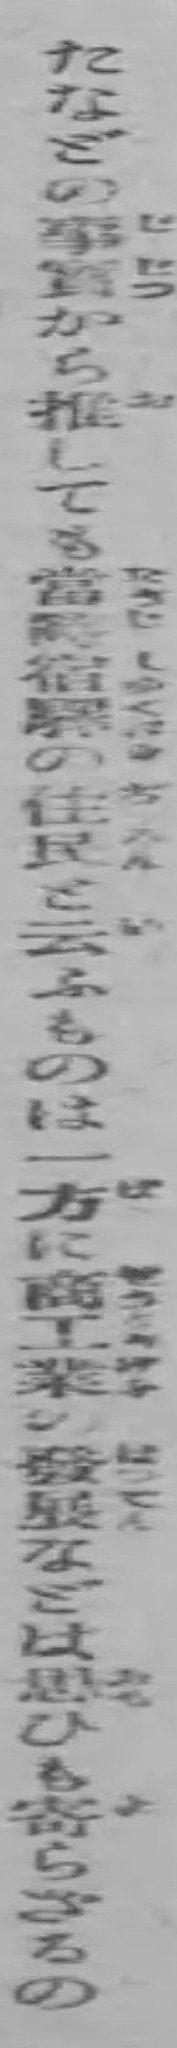たなどの事実から推しても当時宿駅の住民と云ふものは一方に商工業の発展などは思ひも寄らざるの
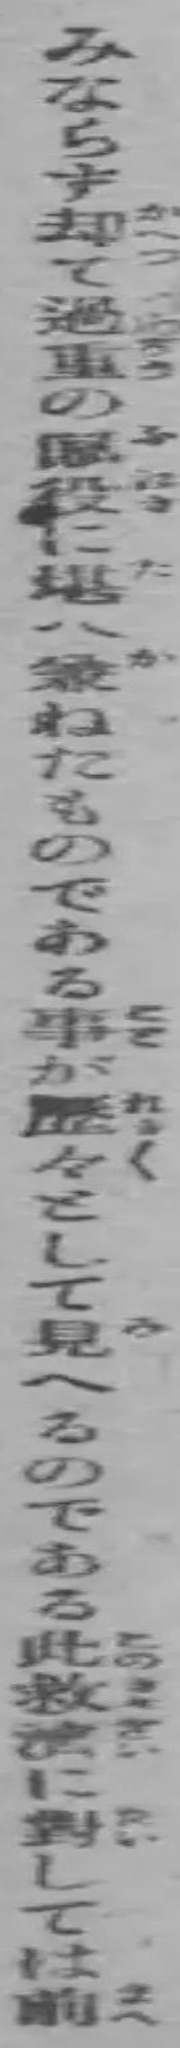みならず却て過重の賦役に堪へ兼ねたものである事が歴々として見へるのである此救済に対しては前

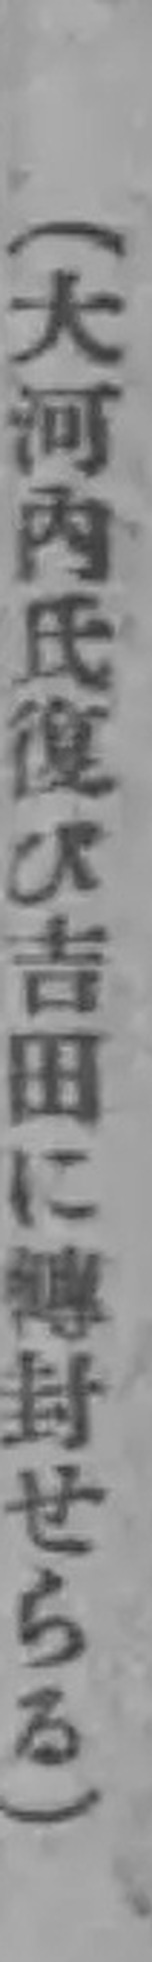⦿大河内氏復び吉田に転封せらる
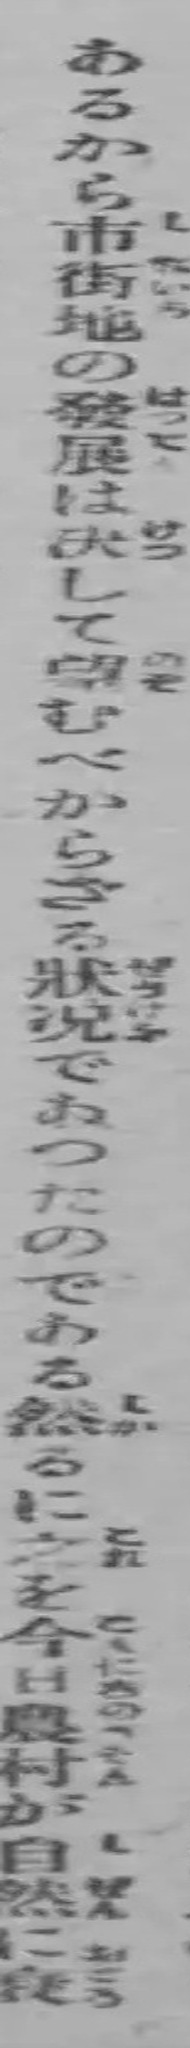あるから市街地の発展は決して望むべからざる状況であつたのである然るに之を今日農村が自然に衰
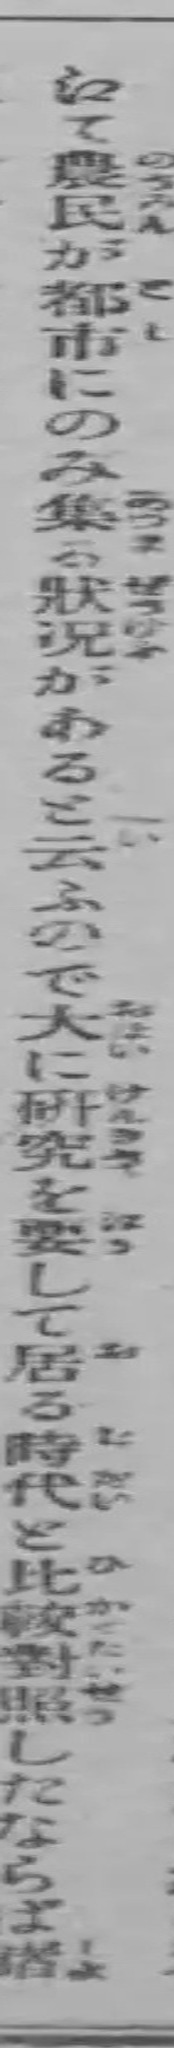えて農民が都市にのみ集る状況があると云ふので大に研究を要してる居る時代と比較対照したならば諸
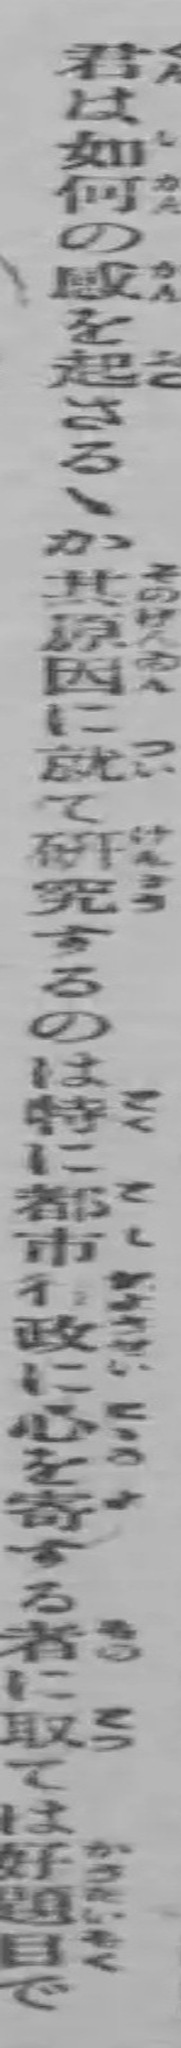君は如何の感を起さるゝか其原因に就て研究するのは特に都市行政に心を寄する者に取ては好題目で
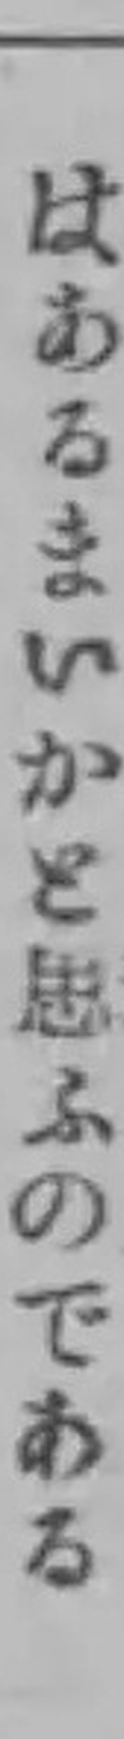はあるまいかと思ふのである
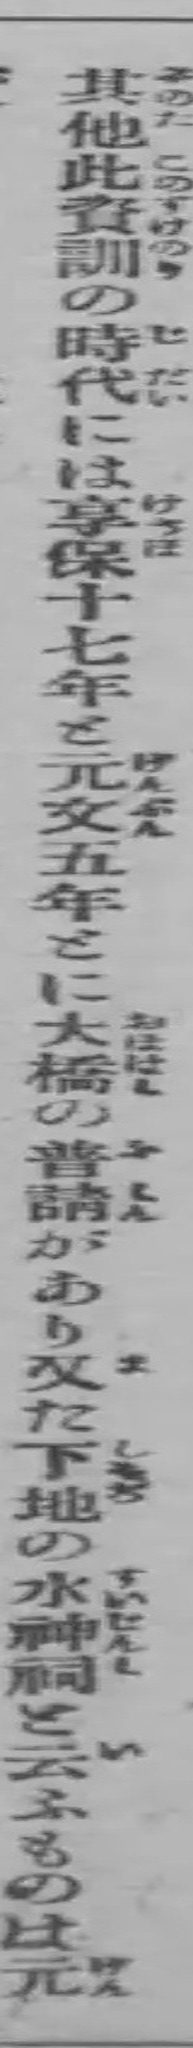其他此資訓の時代には享保十七年と元文五年とに大橋の普請があり又た下地の水神祠と云ふものは元
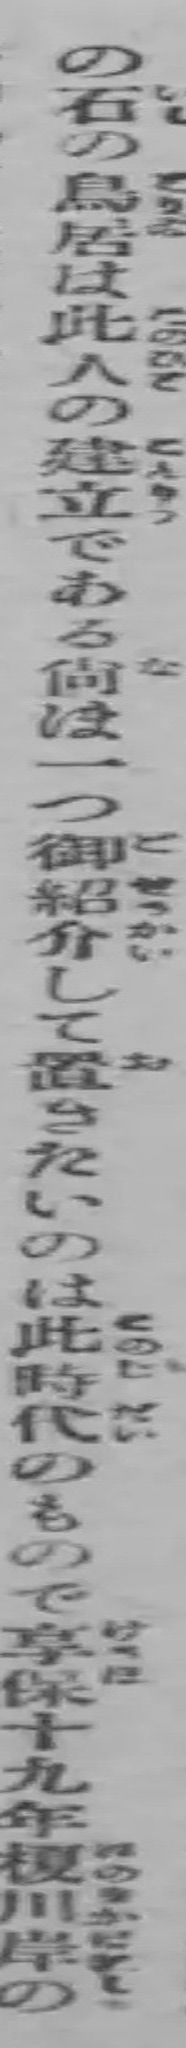の石の鳥居は此人の建立である尚ほ一つ御紹介して置きたいのは此時代のもので享保十九年榎川岸の
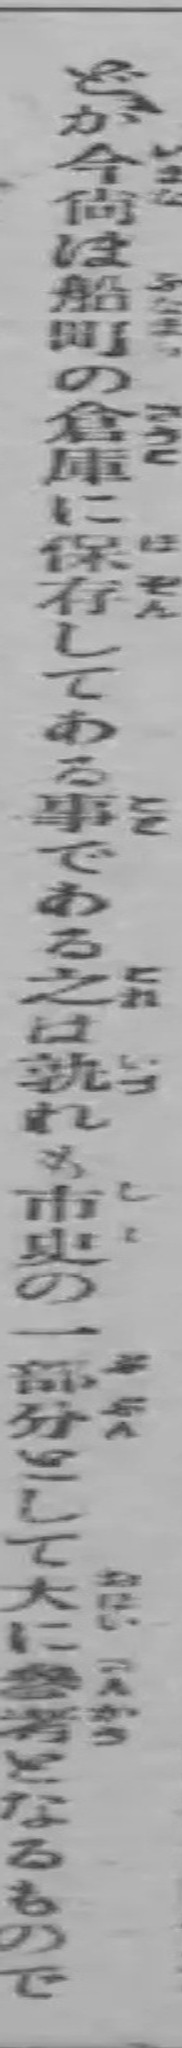どが今尚ほ船町の倉庫に保存してある事である之は孰れも市史の一部分として大に参考となるもので
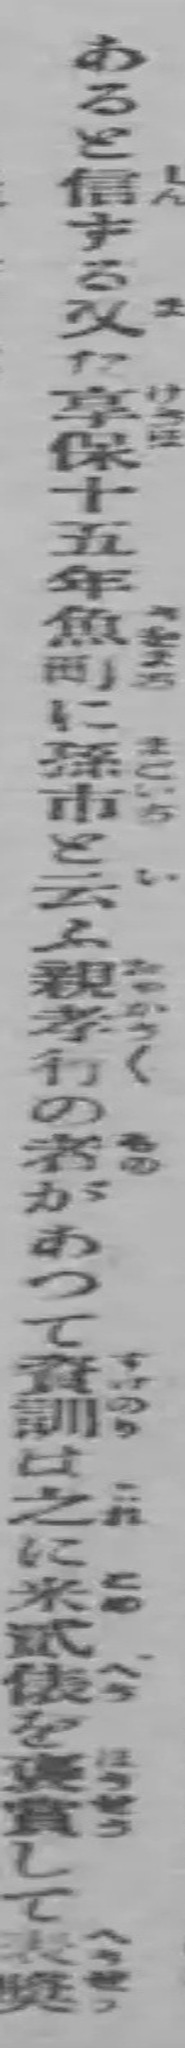孝子旌表あると信ずる又た享保十五年魚町に孫市と云ふ親孝行の者があつて資訓は之に米弐俵を褒賞して表奨
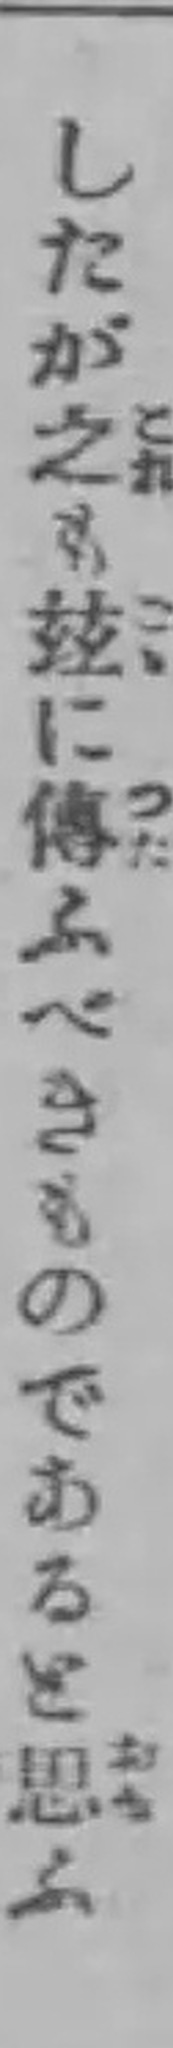したが之も茲に伝ふべきものであると思ふ
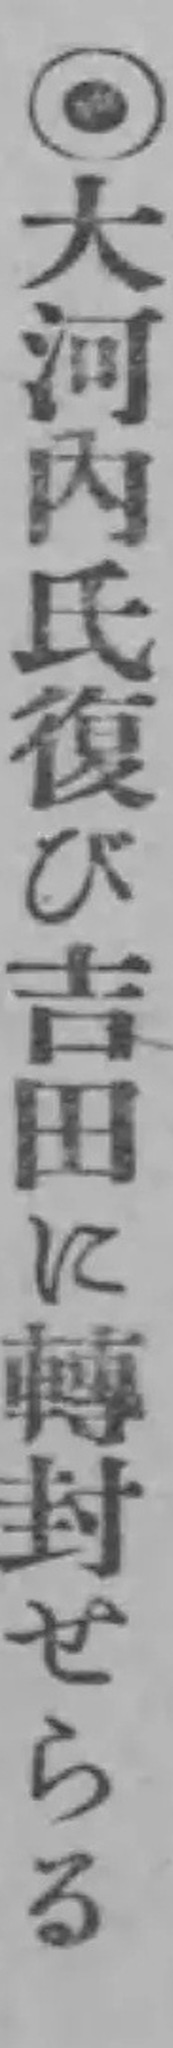⦿大河内氏復び吉田に転封せらる
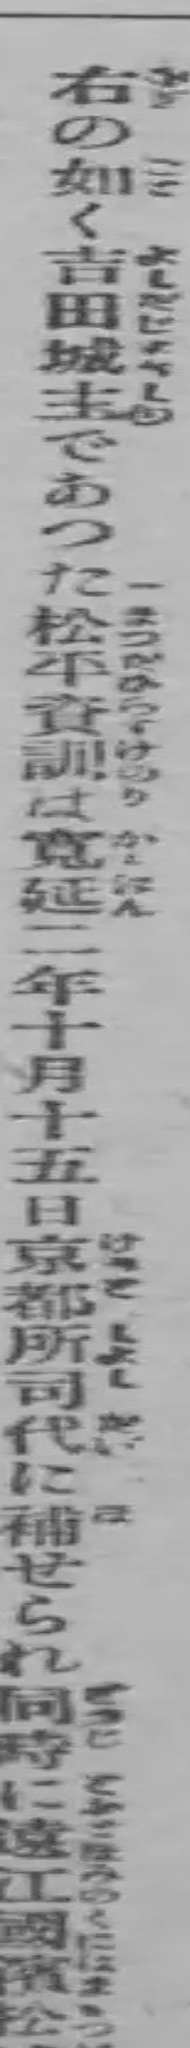右の如く吉田城主であつた松平資訓は寛延二年十月十五日京都所司代に補せられ同時に遠江国浜松城
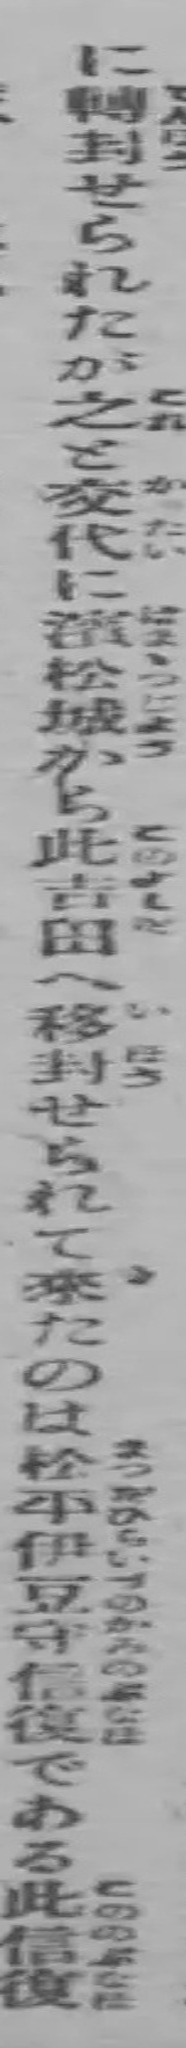に転封せられたが之と交代に浜松城から此吉田へ移封せられて来たのは松平伊豆守信復である此信復
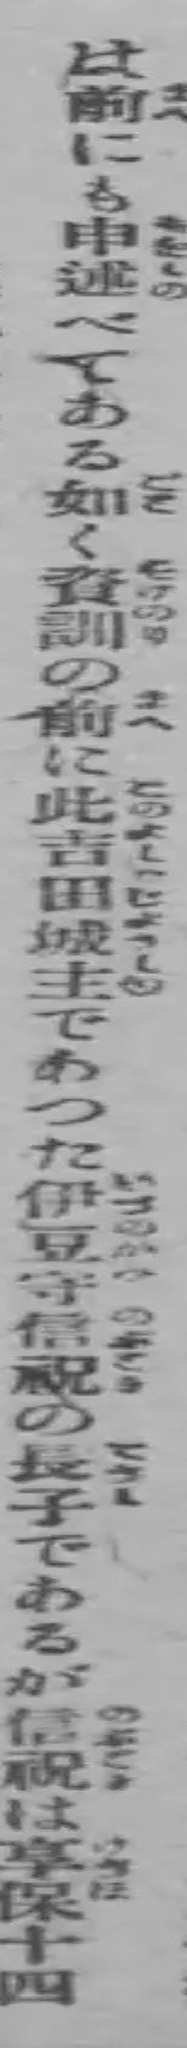は前にも申述べてある如く資訓の前に此吉田城主であつた伊豆守信祝の長子であるが信祝は享保十四
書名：豊橋市史談
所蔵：国立国会図書館 National Diet Library, JAPAN
